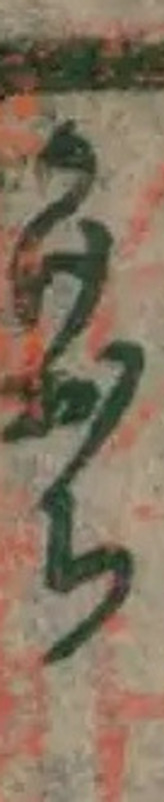かけおち
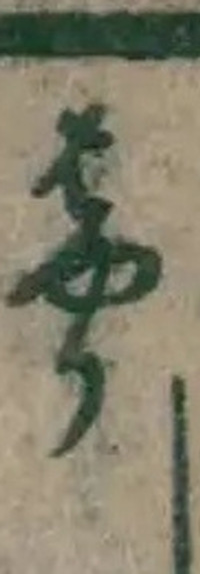はやり
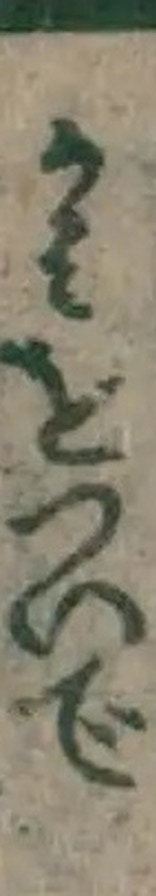かみをついで
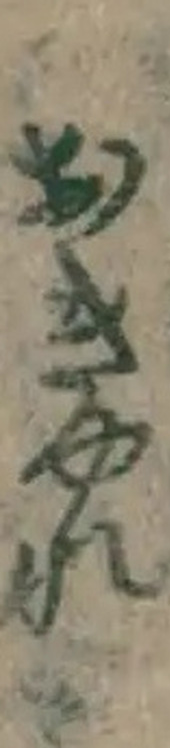おきやれ

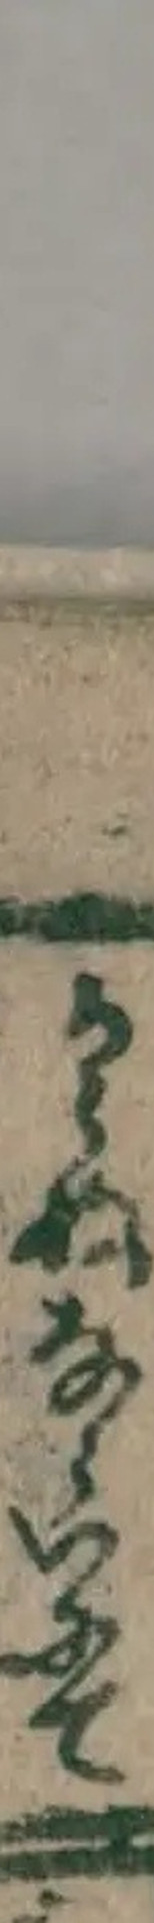からぬならいにて
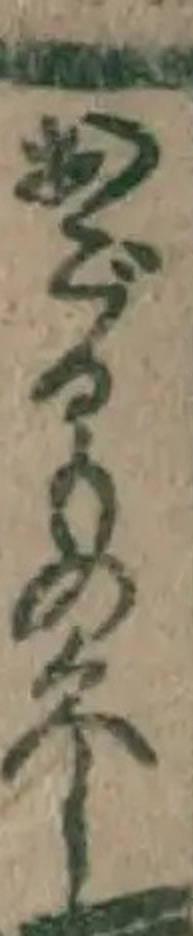おごるもの久し
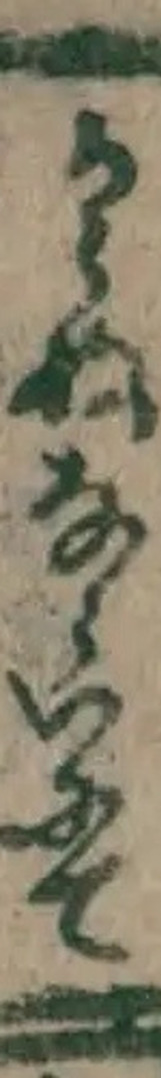からぬならいにて
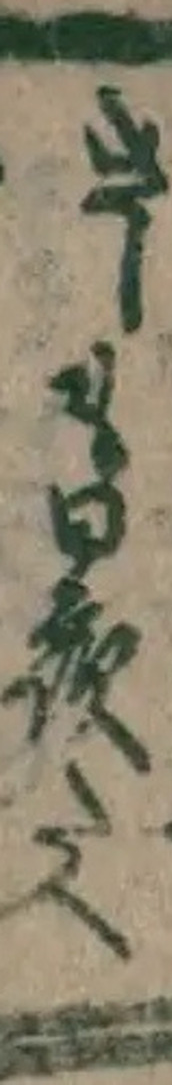さしも日夜たへ
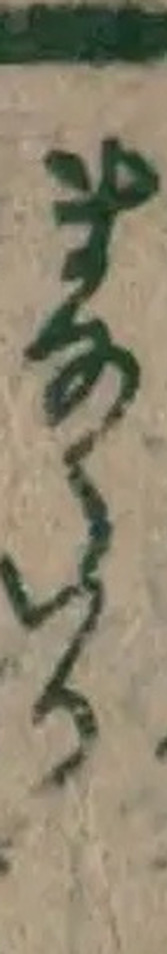まなくいり
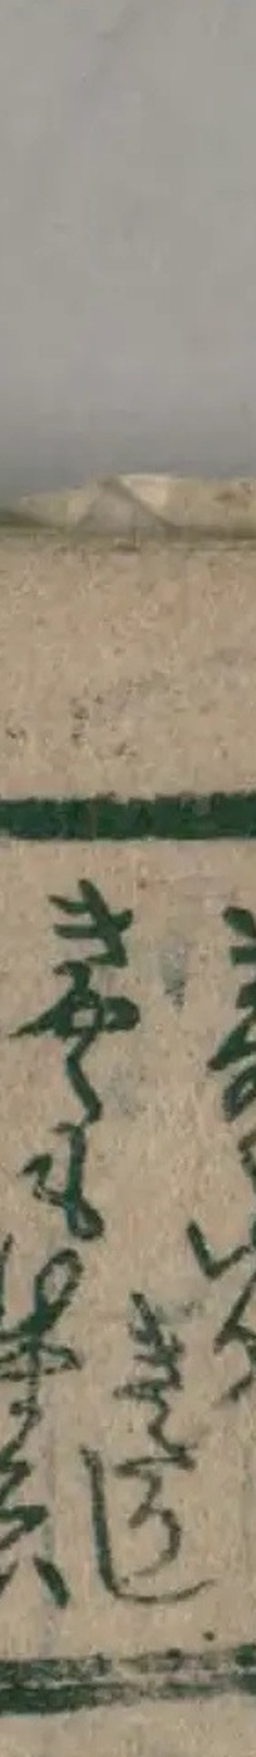きやくもむすこは
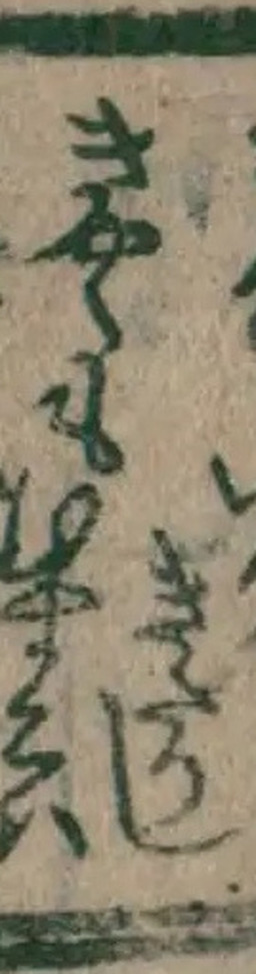きやくもむすこは
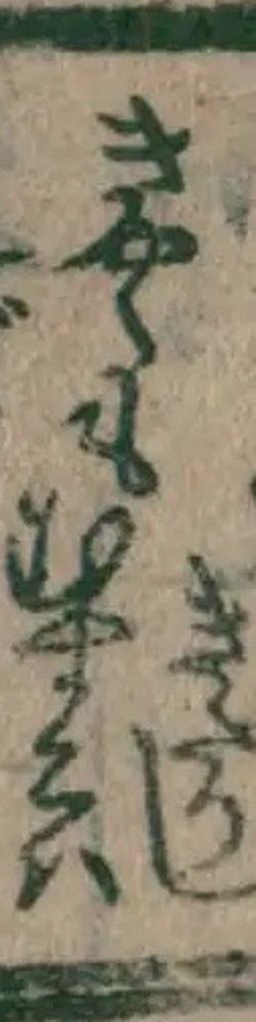きやくもむすこは
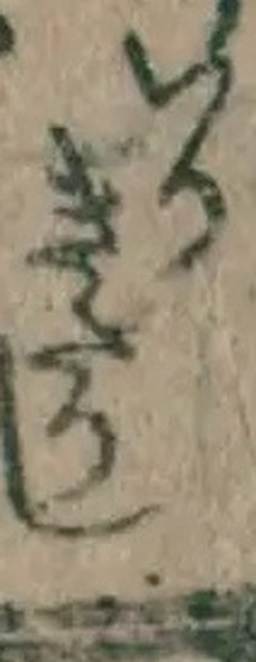きたりし
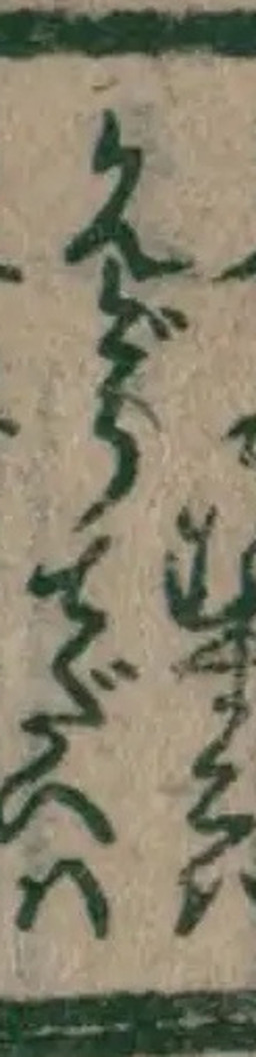かんどうてだいは
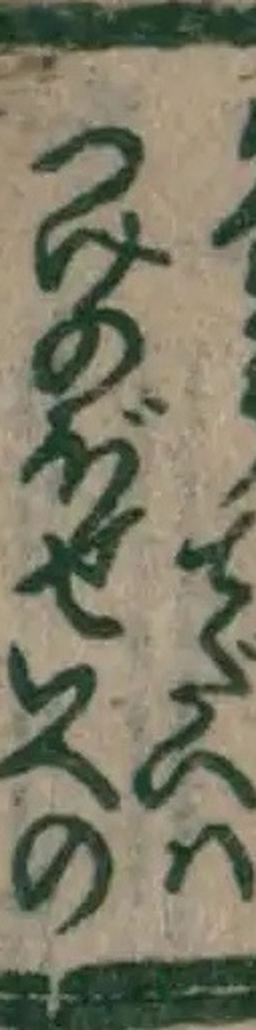つけのぼせいへの
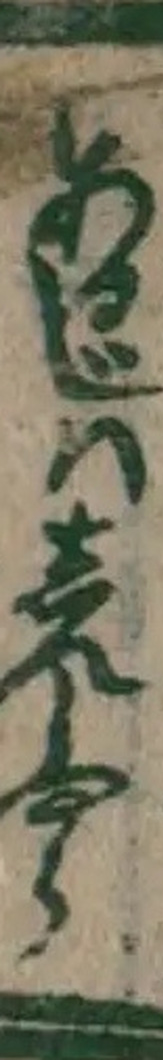あるじはしんしやう
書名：頓作時雨月 3巻
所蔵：国立国会図書館 National Diet Library, JAPAN
